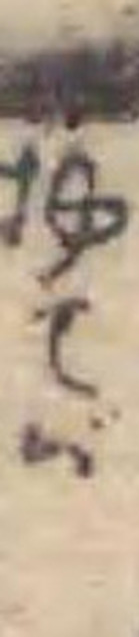おてが
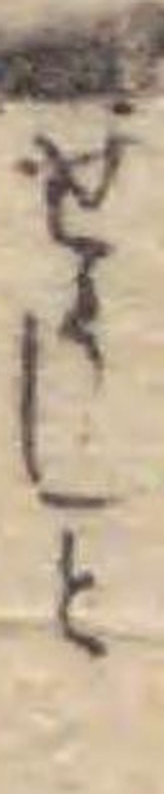せうしと
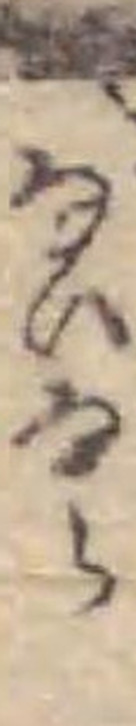ないなら
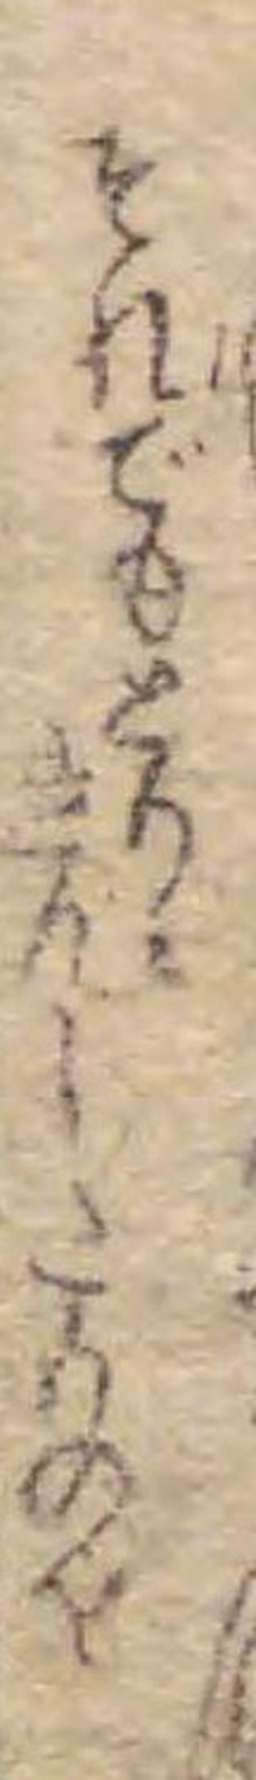それでもとりに
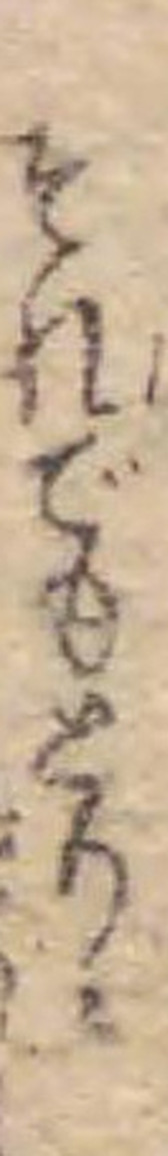それでもとりに
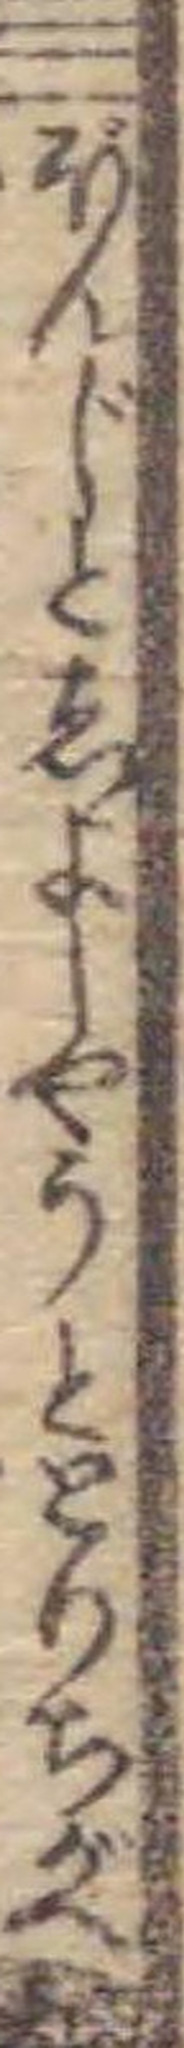ぼんじとしよしやうととりちがへ
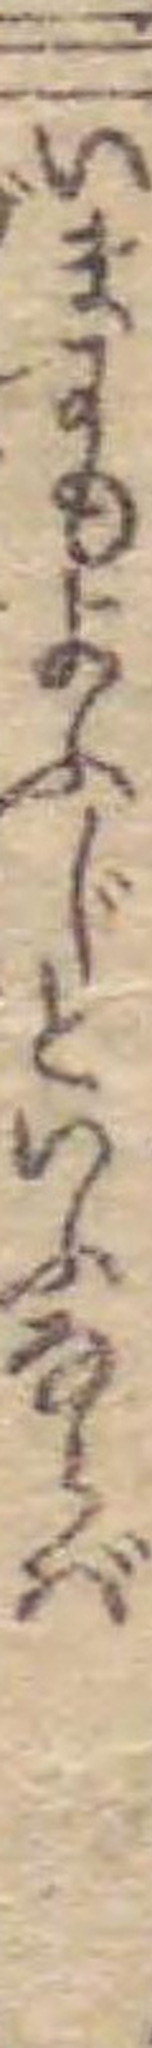いまにもよふじといふならば
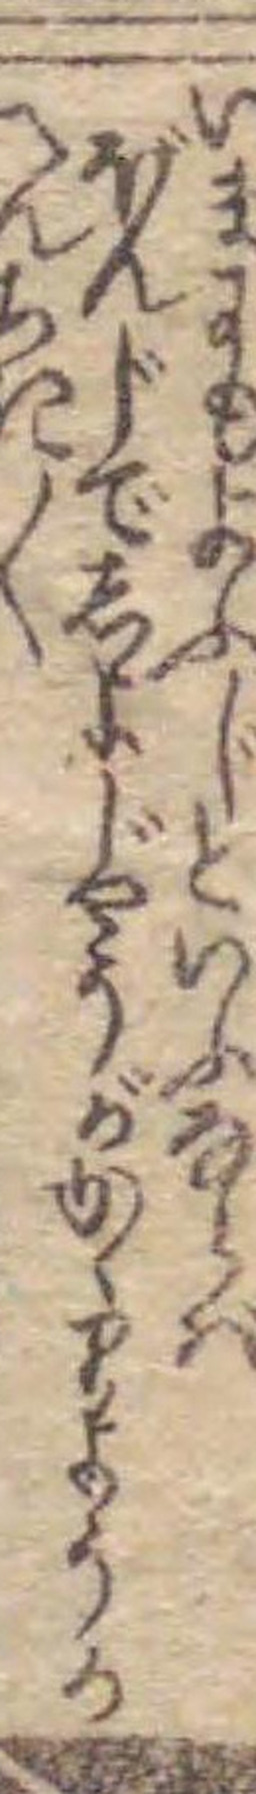ぼんじでしよじやうがかゝりようか
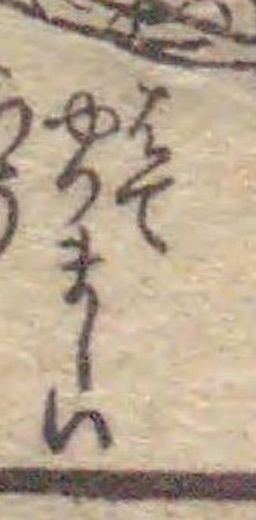やかましい
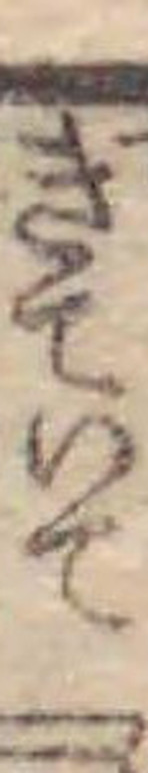きていて
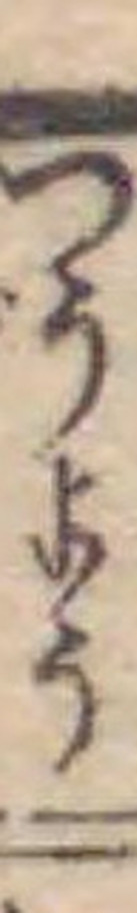つうよう
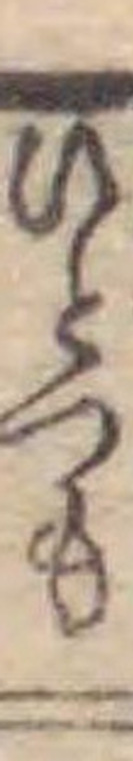ひとつも
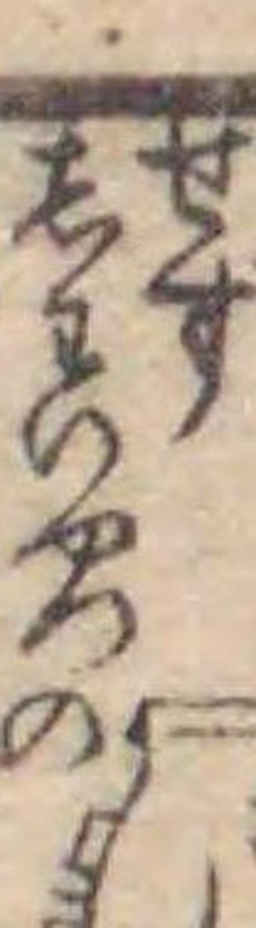しわいやつの
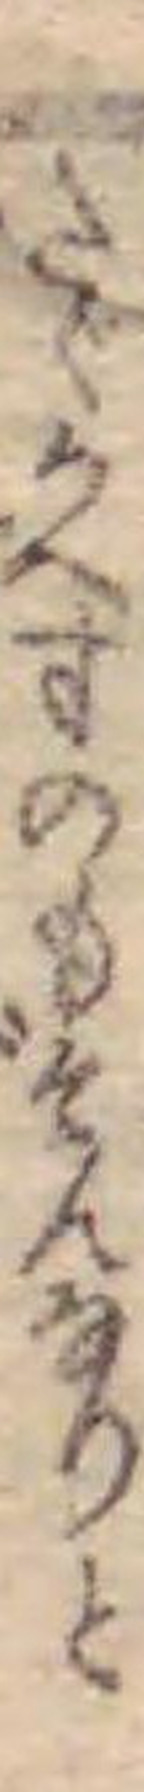たゞかへすのもそんなりと
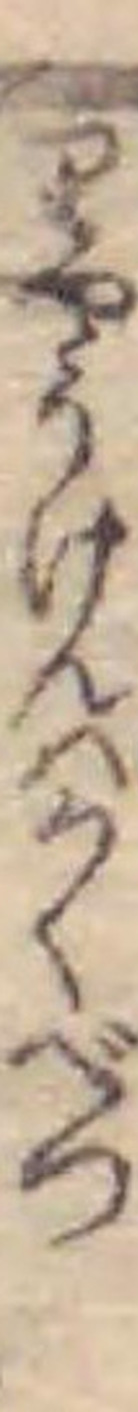りやうけんはかくべつ
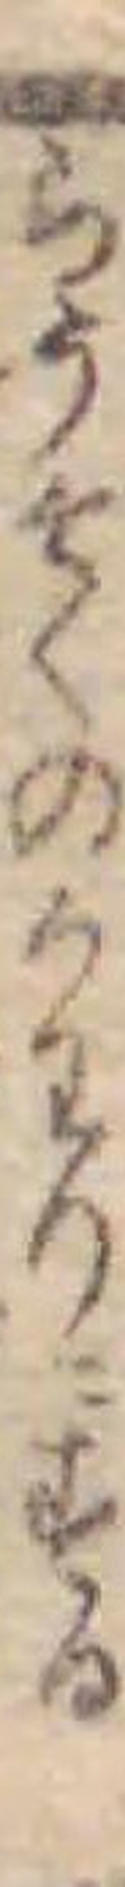らうそくのかわりにする
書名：大悲の千六本 : 1巻
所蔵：国立国会図書館 National Diet Library, JAPAN
